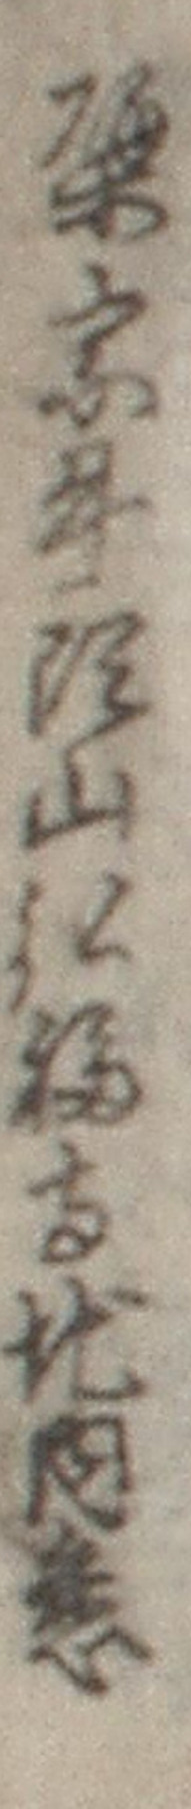檗宗牛陀山弘福寺地内變

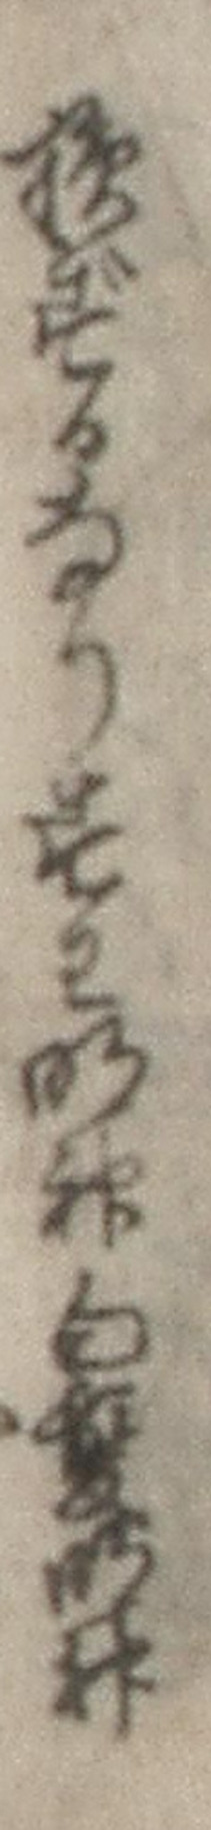損ずるなりすわ明神白髭明神
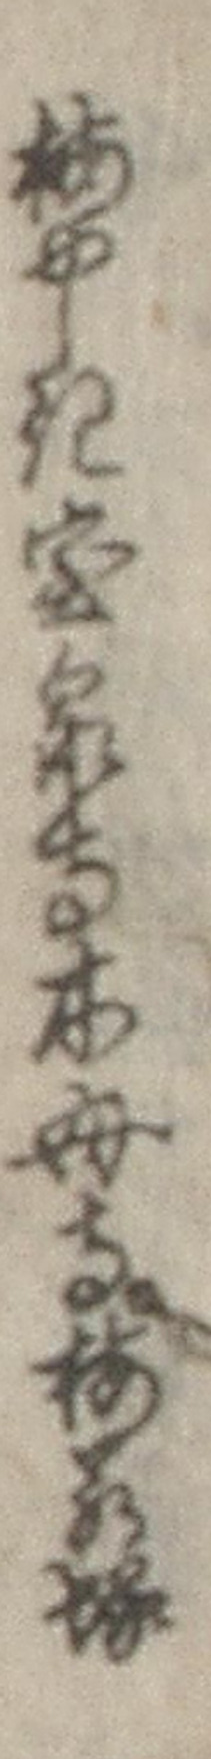梅やしき宝泉寺木母寺梅若塚
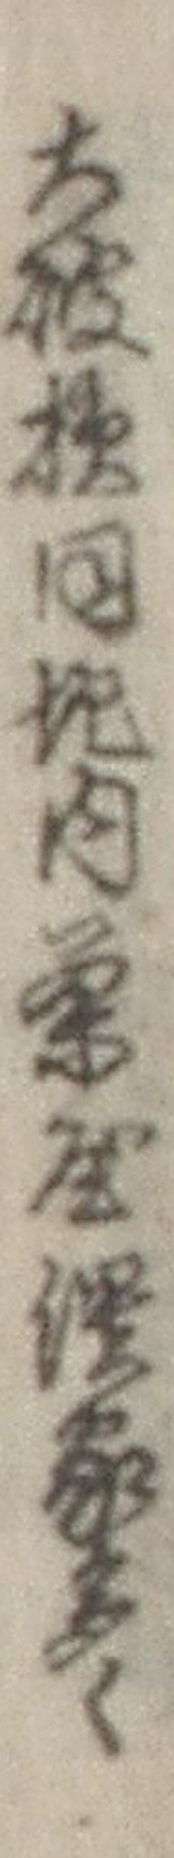大破損同地内菊屋潰家多く
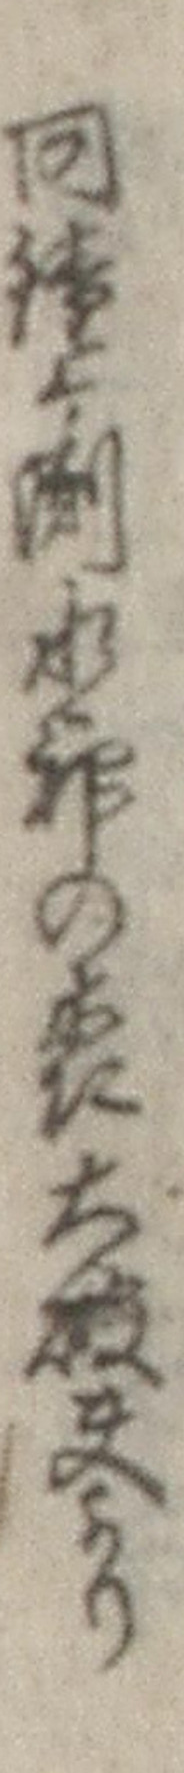同鐘ケ渕水神の森大破夫より
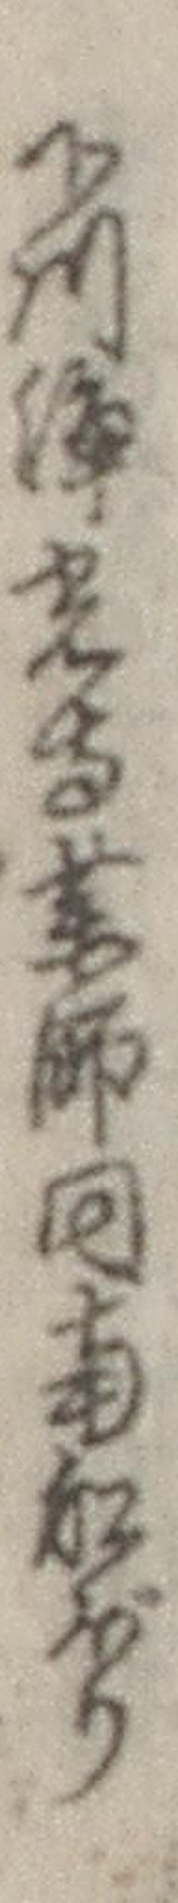下川俥光寺薬師同南舩ぼり
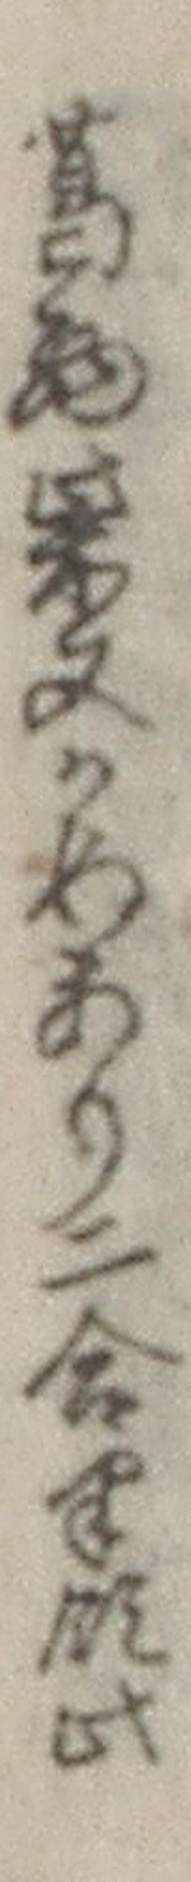葛西柴又かめあり二合半餘此
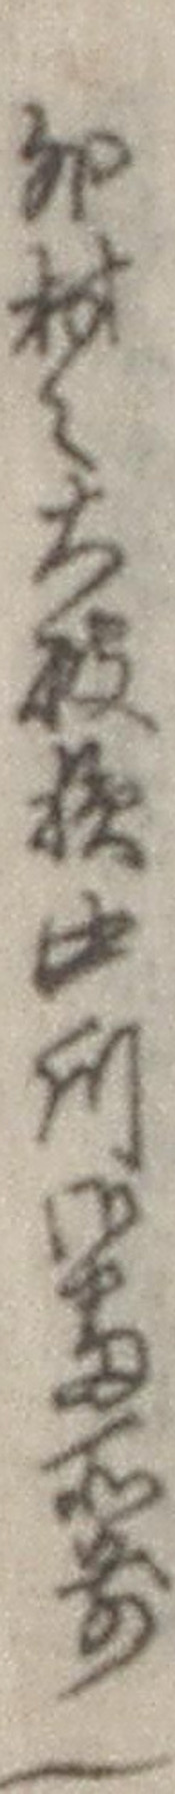外村〻大破損中川御番所前
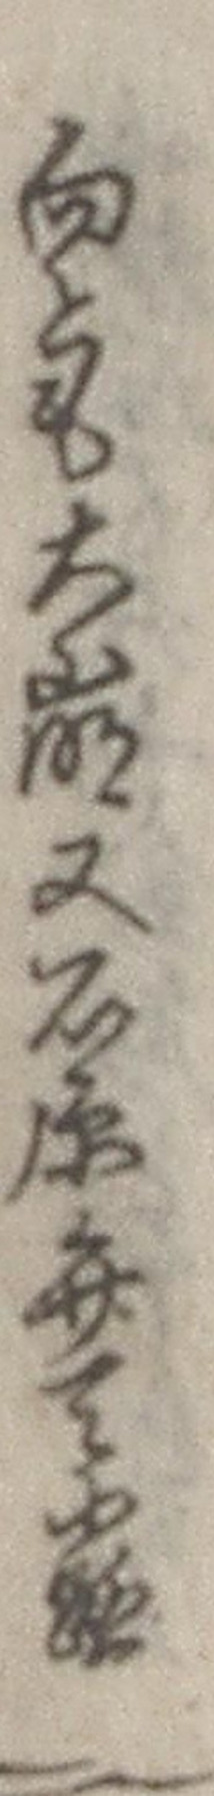向とも大崩又石原弁天小路
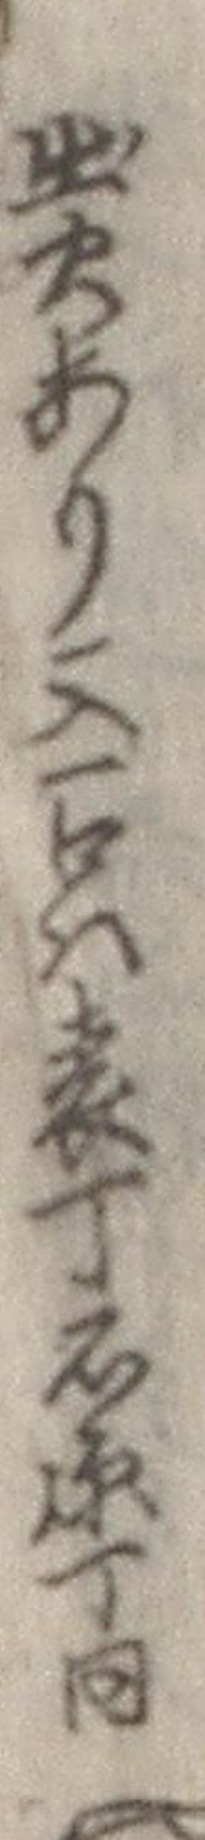出火あり一入一口は表丁石原丁同
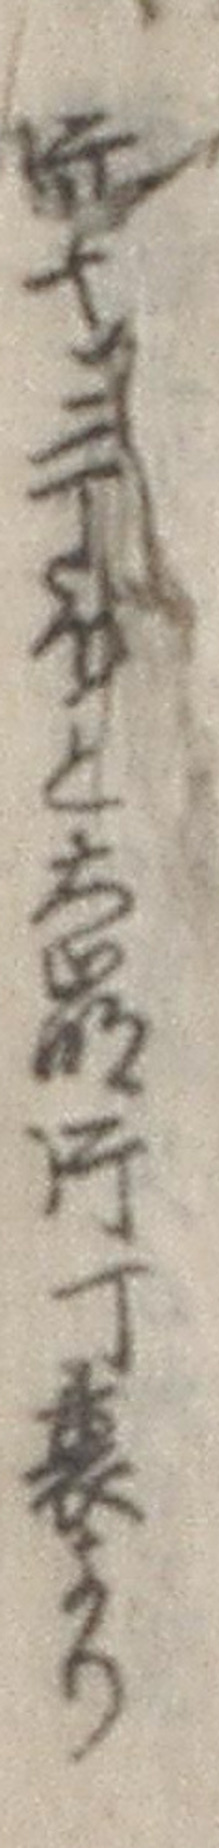所十三丁ほと大崩片丁裏より
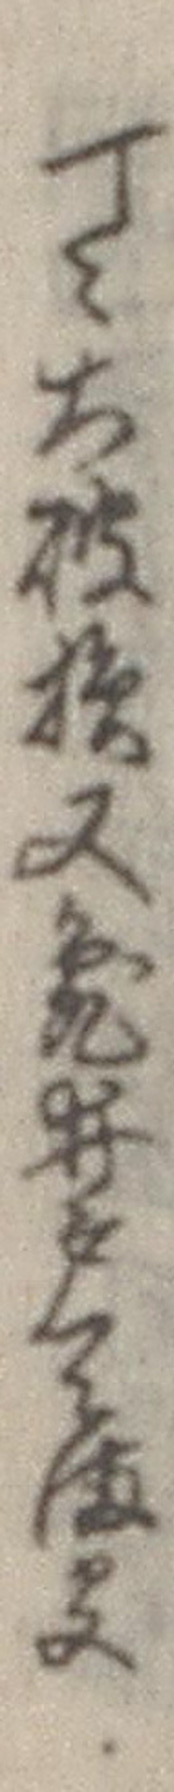丁〻大破損又亀井戸天満宮
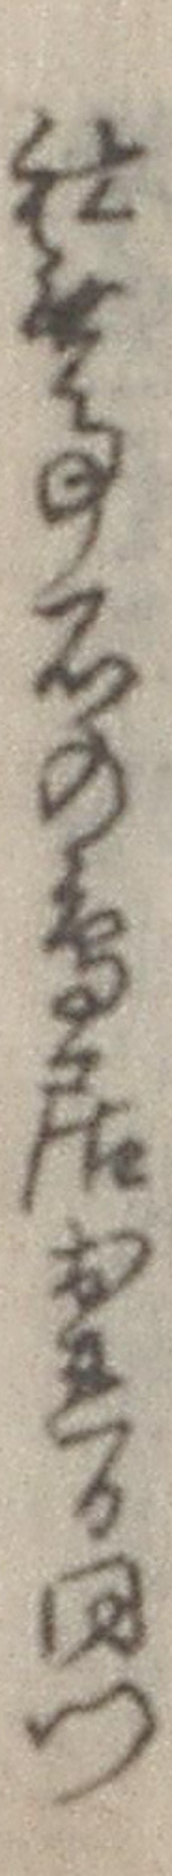社無事石の鳥居おれる同門
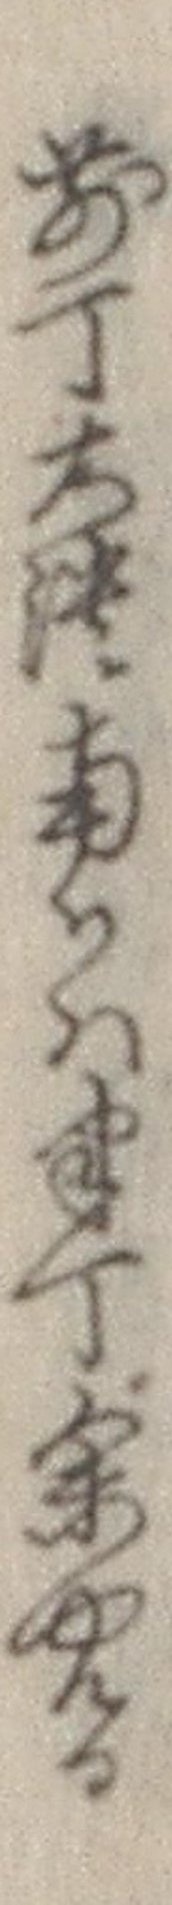前丁大潰南かは半丁余やける
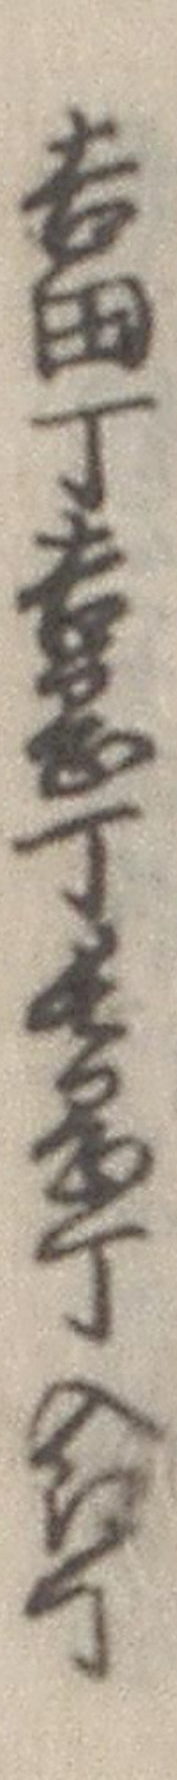吉田丁吉岡丁長岡丁入江丁
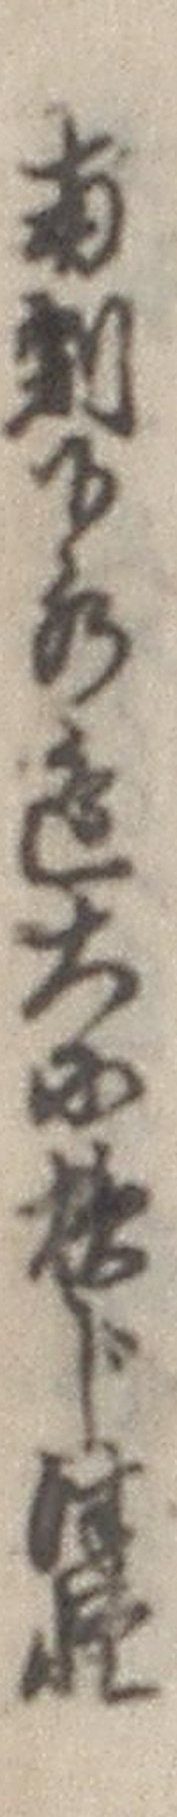南割下水邊大に損じ津軽
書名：江戸　大地震臣細録　全
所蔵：東京大学地震研究所図書室 Earthquake Research Institute Library, The University of Tokyo, JAPAN
